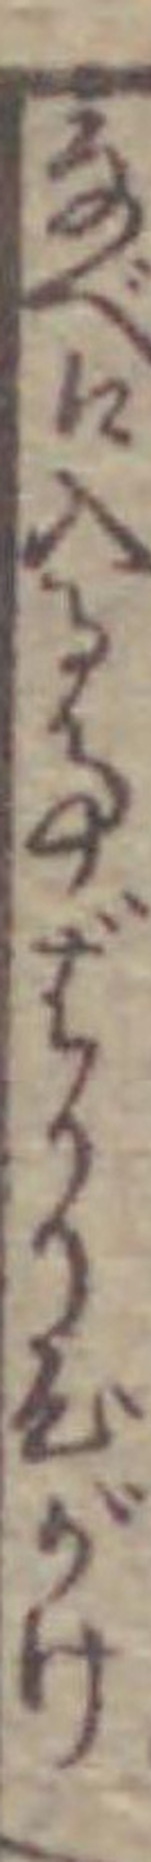なべに入る事ばかり心がけ
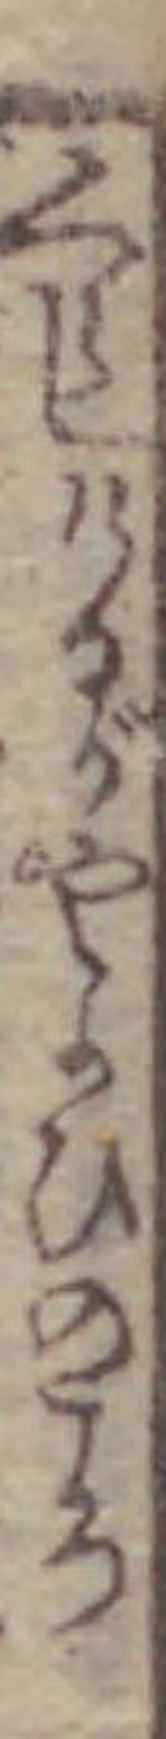くらしけるがやよひのころ
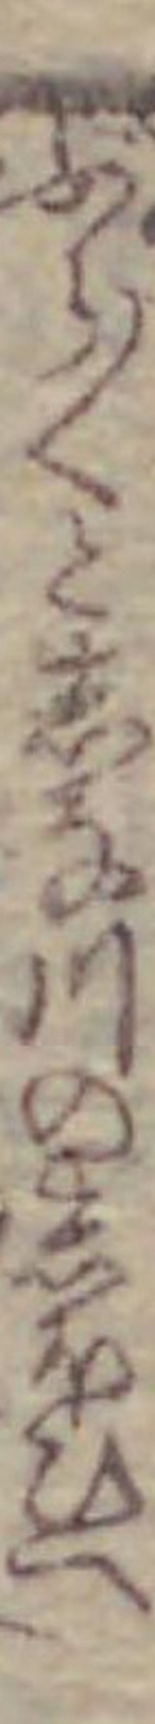ぶら〳〵としな川のしほひへ
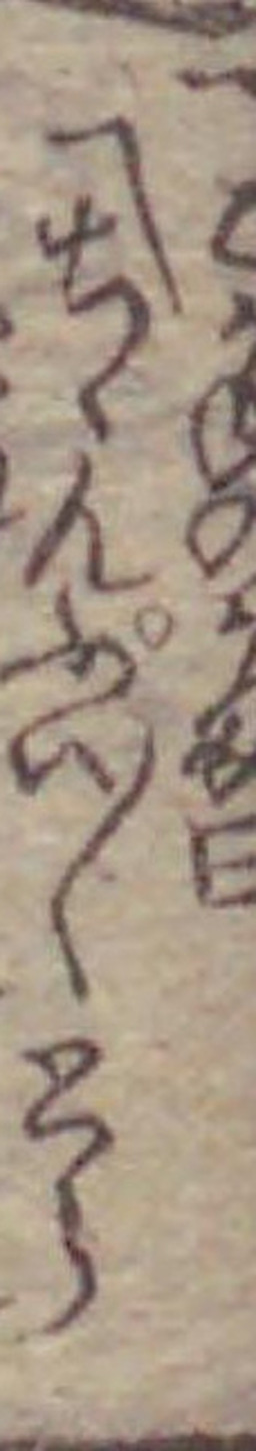〽ちゝんぷい〳〵とら
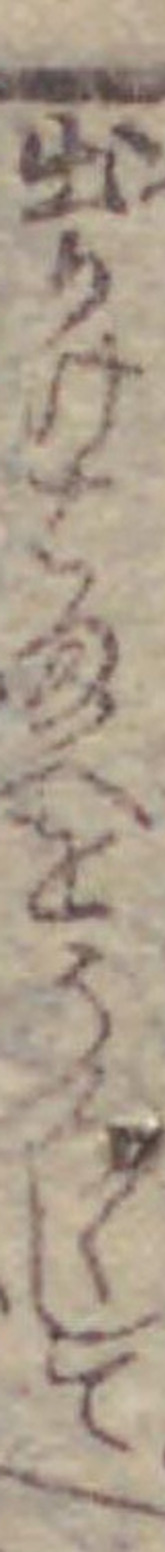出かけはまへをうろ〳〵して
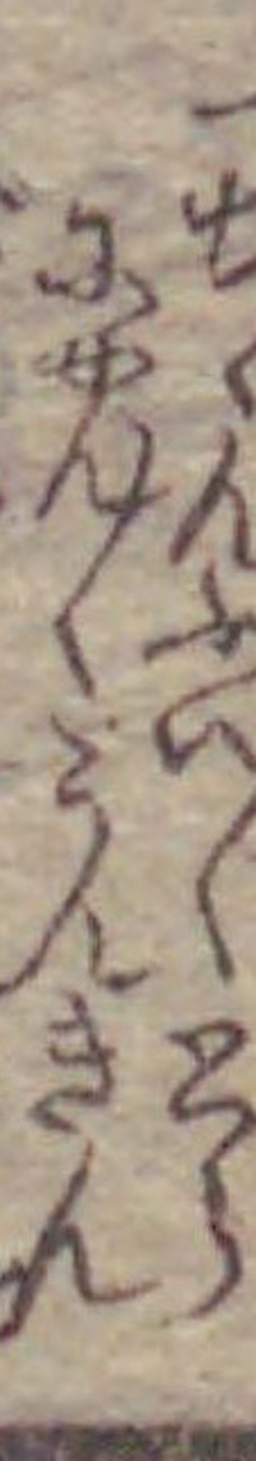にやん〳〵うんきん
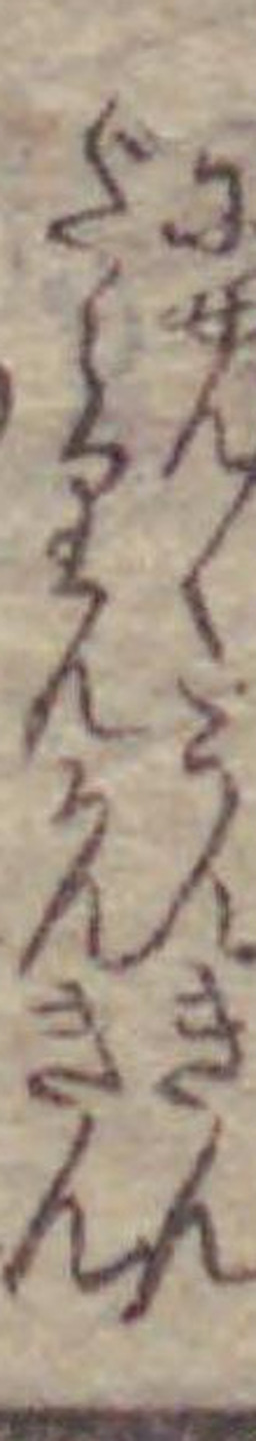だらりんかんきん
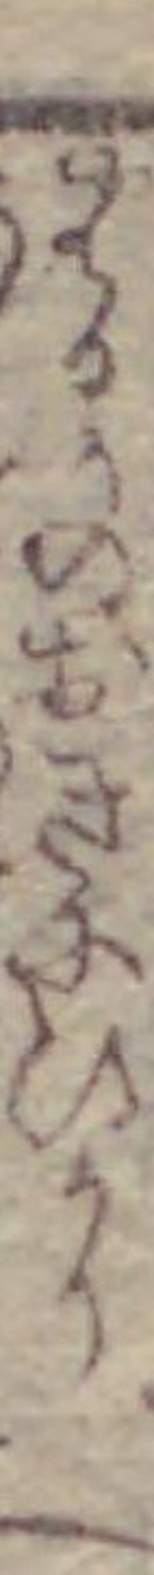はるかのおきにひかり
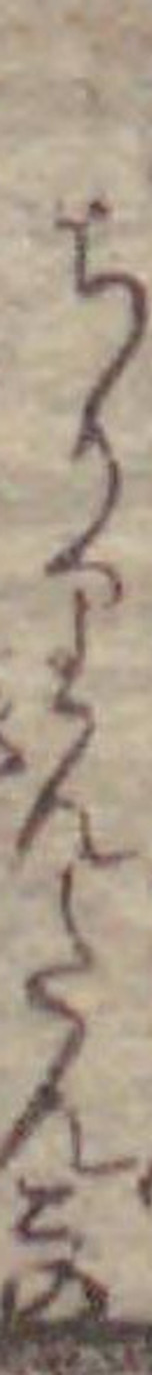ちりりんたんこの
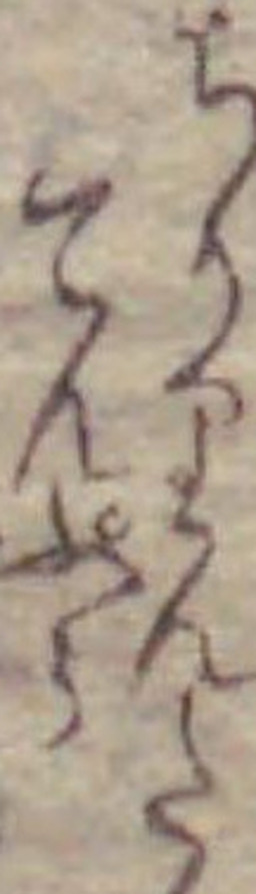てんぷら
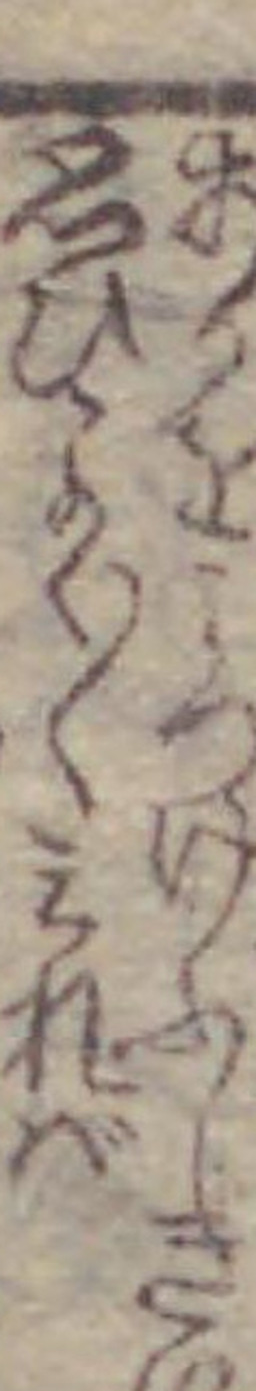思ひよく〳〵みれば
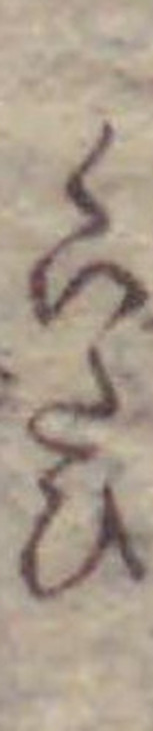くひたひ
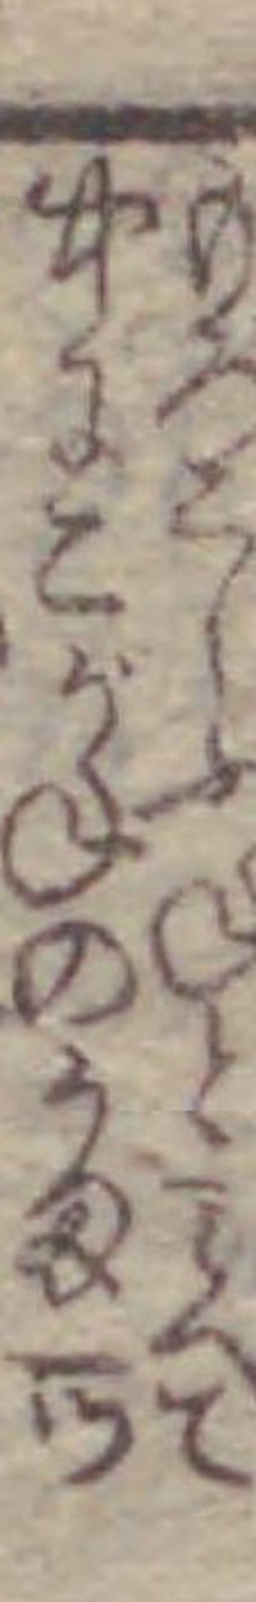中にこがねのかま一つ
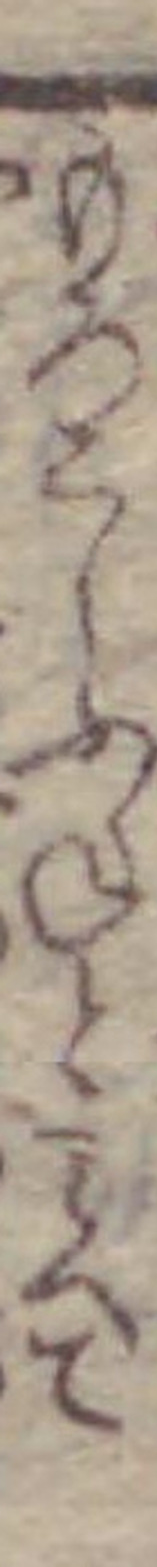もろこしふねとみへて
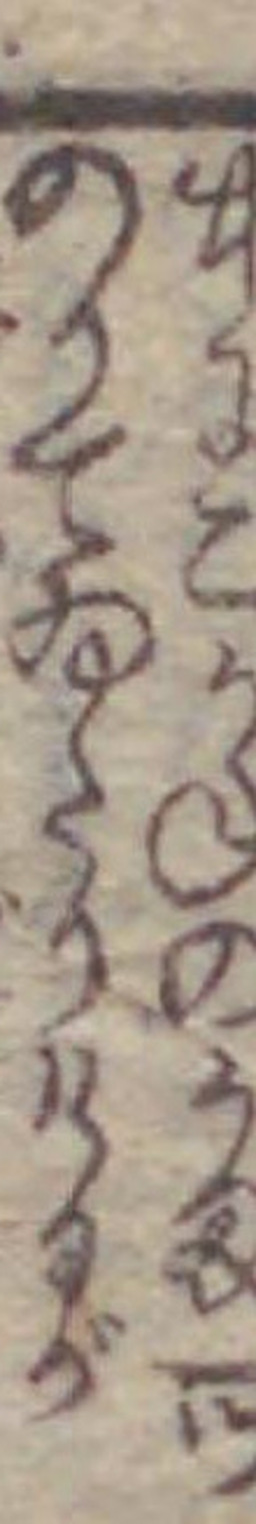のりてゐたりけるが
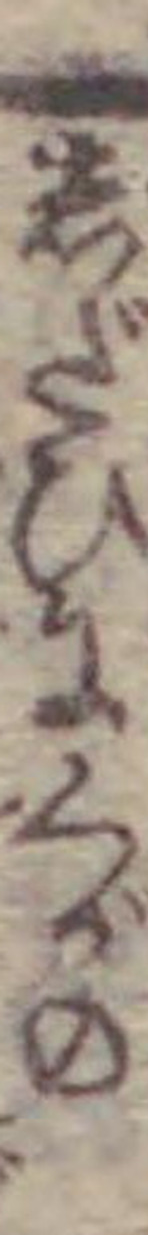しだひにくがの
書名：万物小遣帳 : 2巻
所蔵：国立国会図書館 National Diet Library, JAPAN
